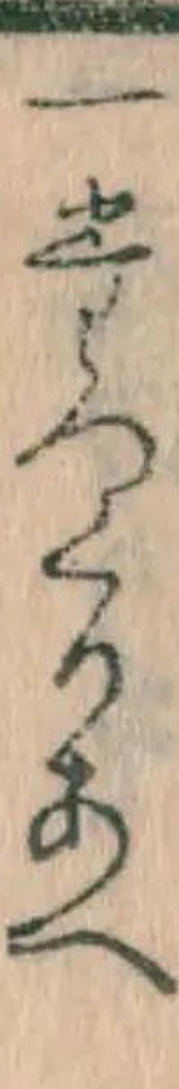一たつくりあへ
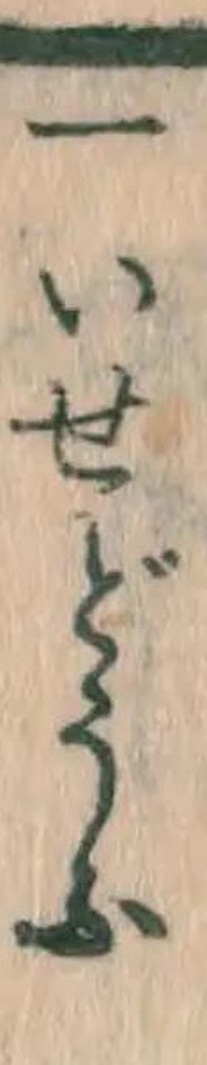一いせどうふ
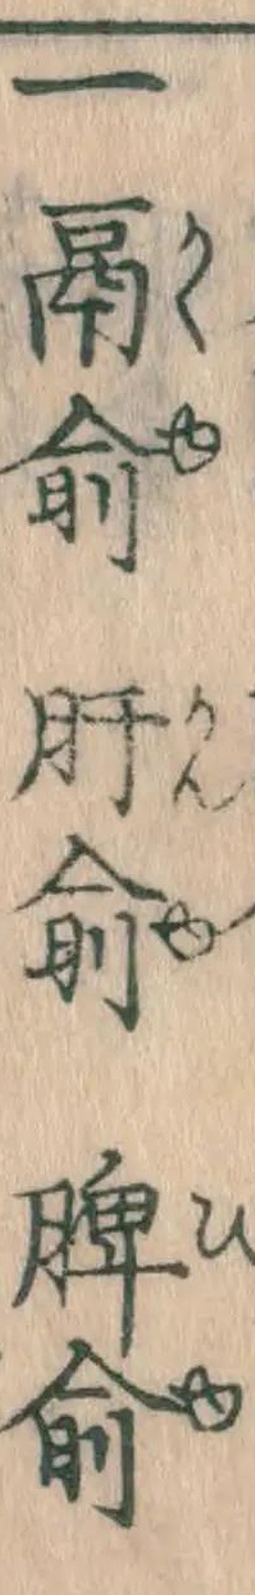一鬲兪肝兪脾兪
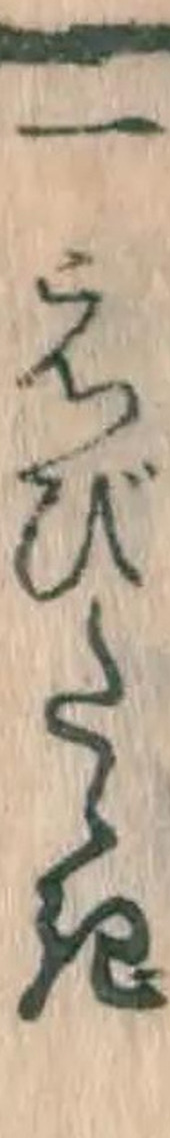一えびたゝき
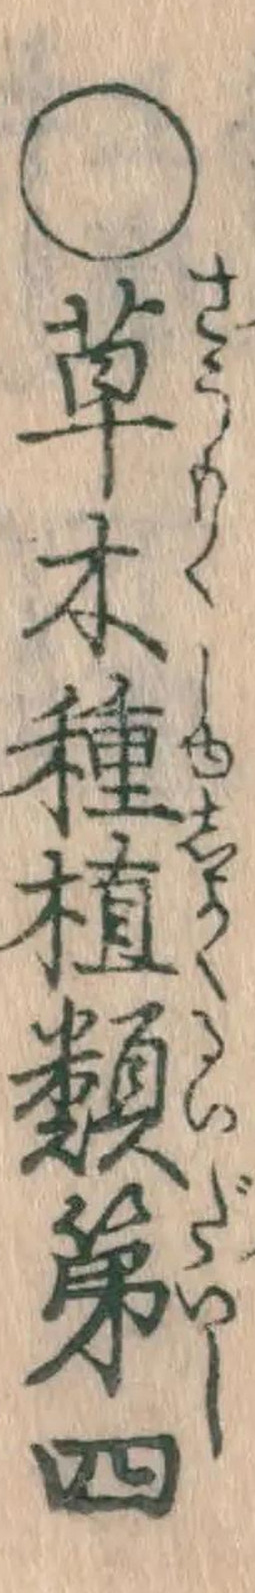○草木種植類第四
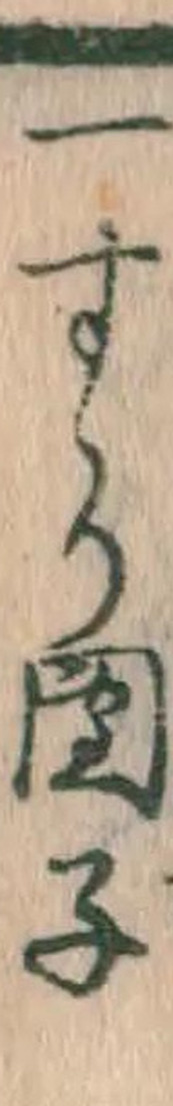一すゝり団子
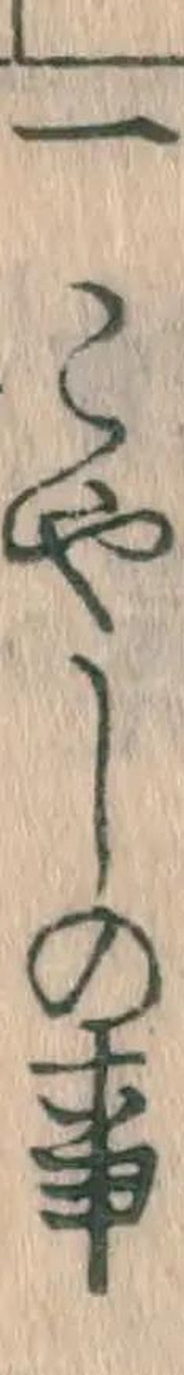一こやしの事
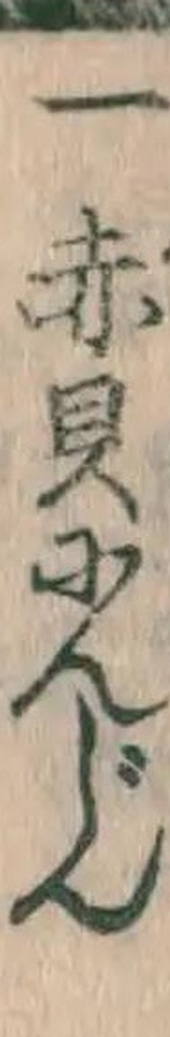一赤貝にんじん
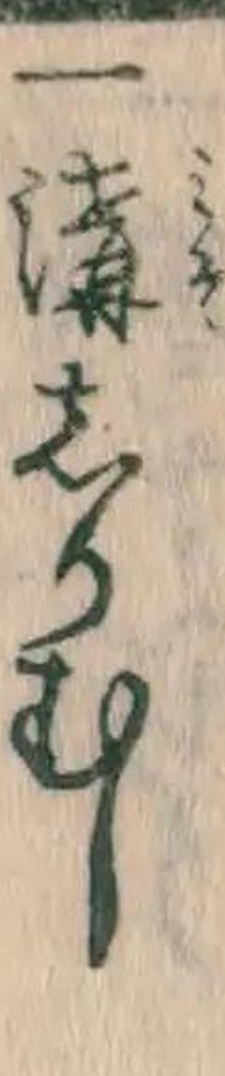一溝しりむし
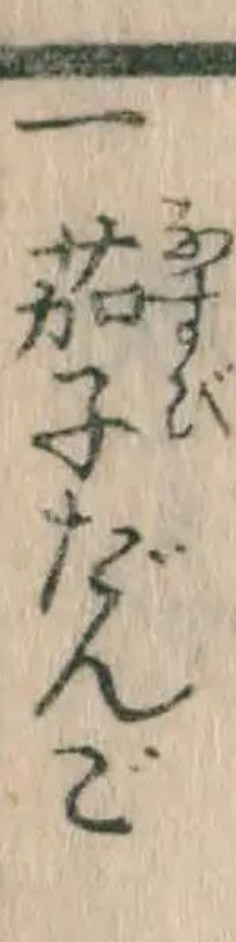一茄子だんご
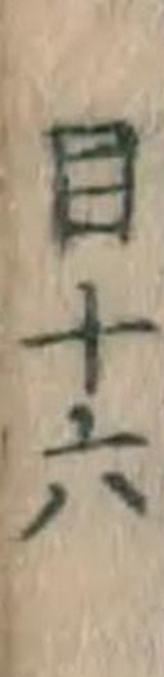目十六

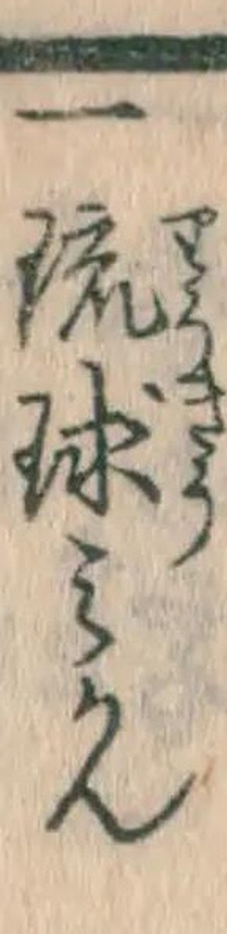一琉球みかん
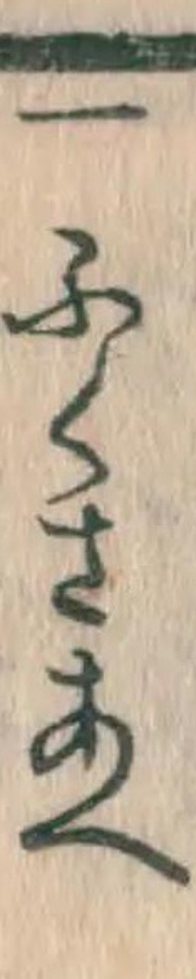一ふくさあへ
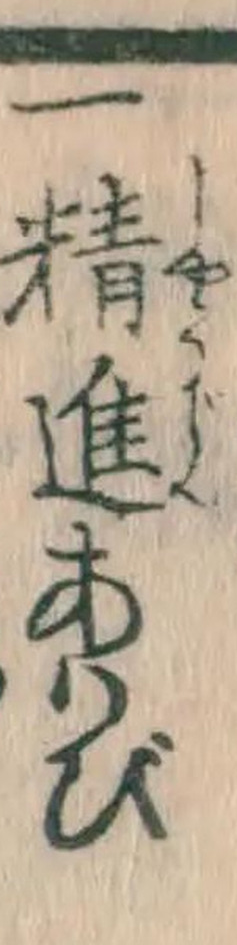一精進あはび
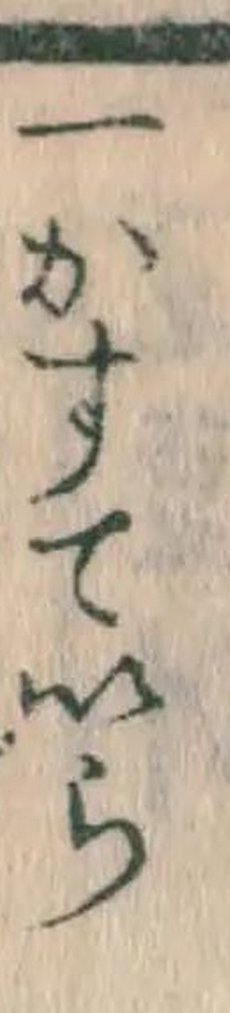一かすていら
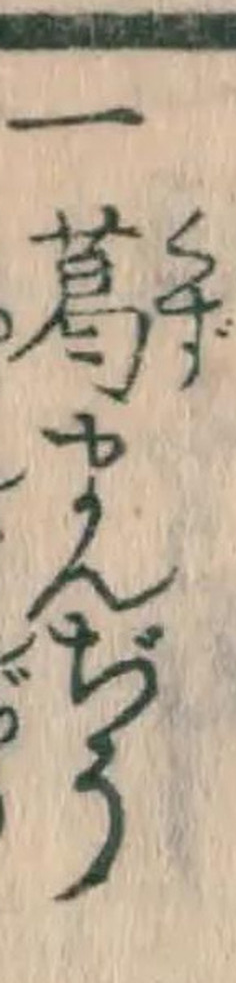一葛まんぢう
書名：広益秘事大全 3巻. [1]
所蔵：国立国会図書館 National Diet Library, JAPAN
